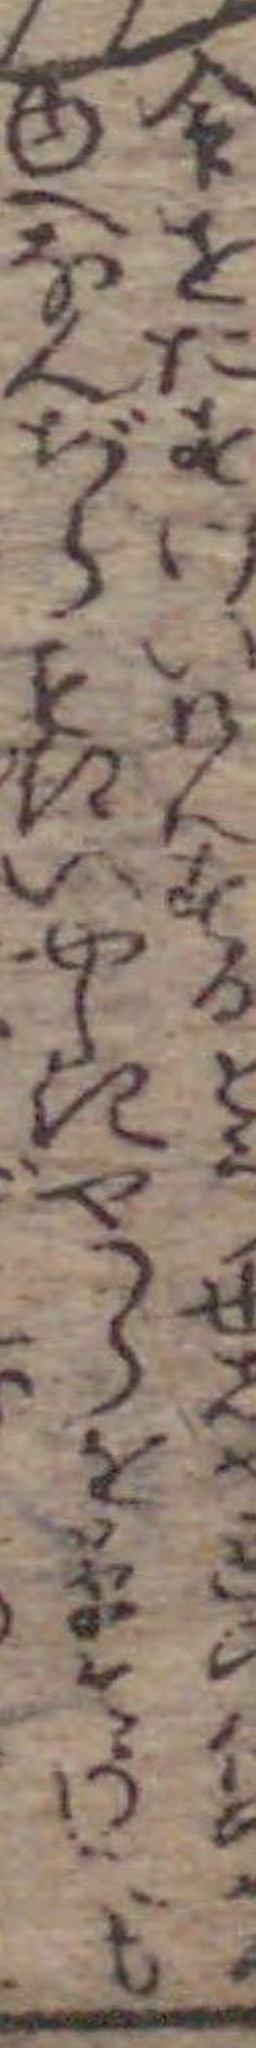ゆへなんぢらこときいやしきやからを草そうしにも
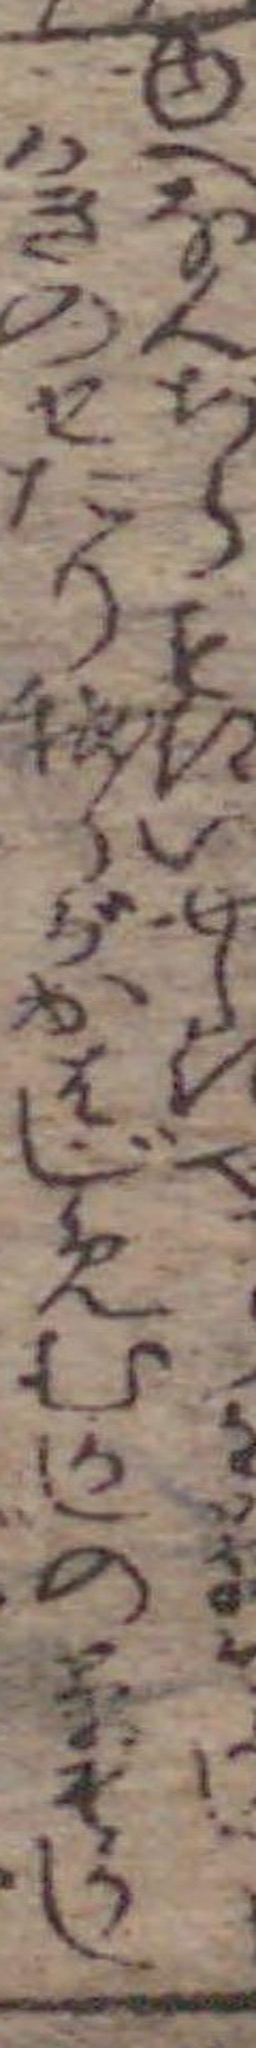かきのせたり我らが出はじめむかしの草そうし
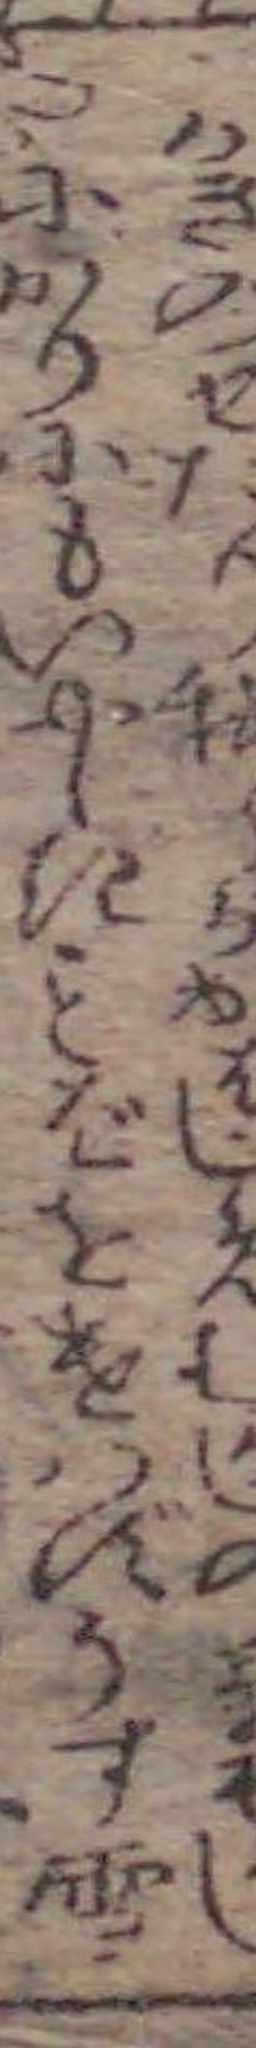にかりにもいやしきことばを遣はずうす雪
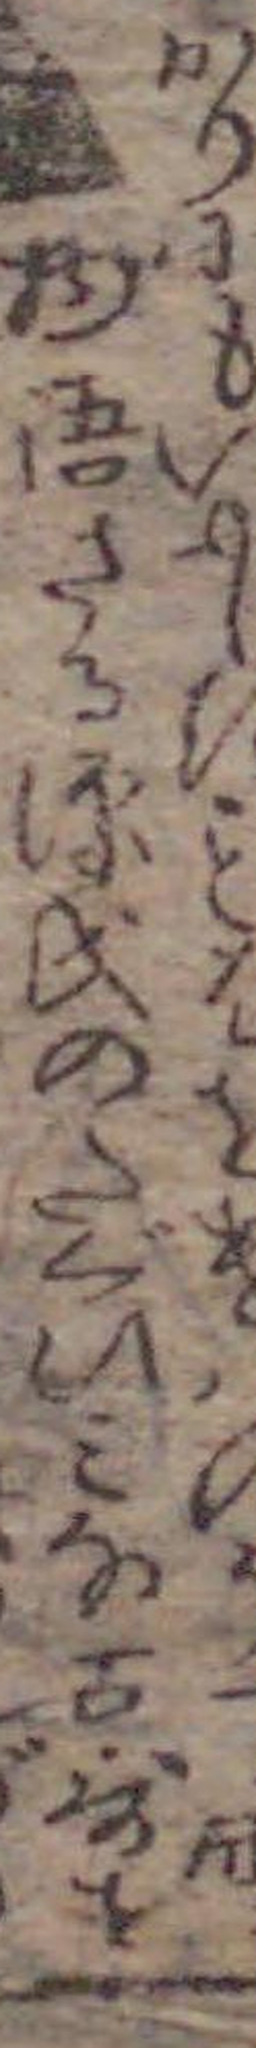物語さる源氏のたぐひみな古歌を
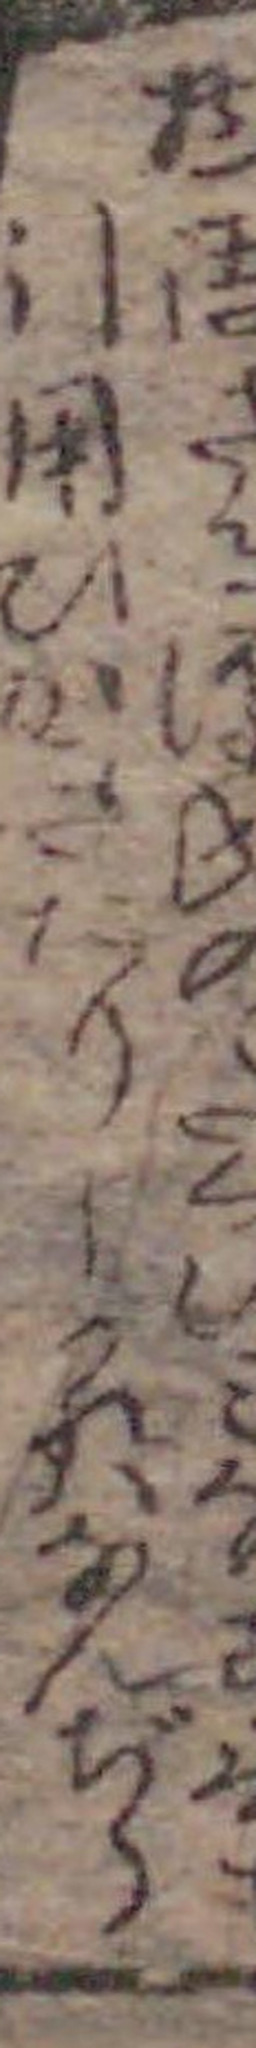引用ひかきたりしかれはなんぢら
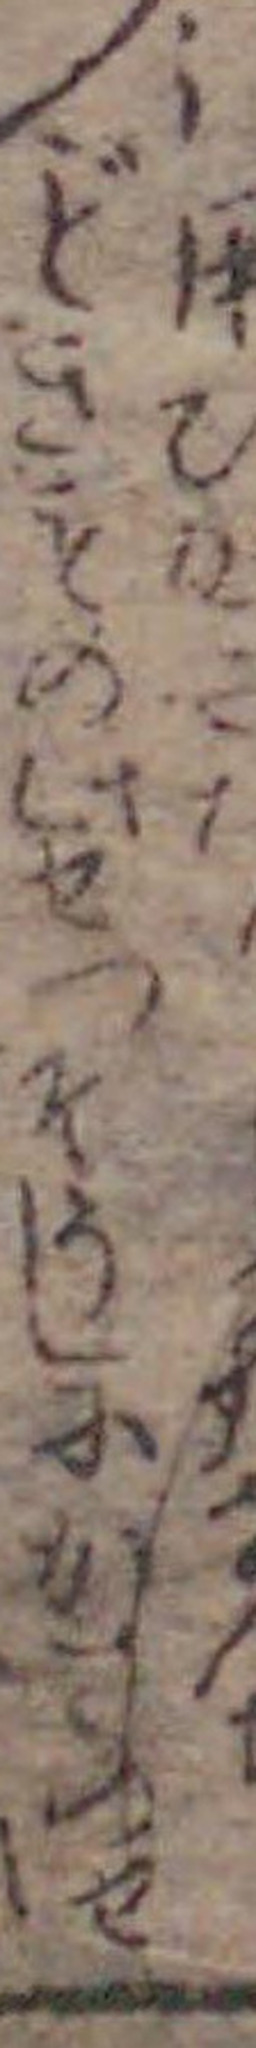ごときもの此せつそうしにかきのせ
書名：辞闘戦新根 （国会）
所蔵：国立国会図書館 National Diet Library, JAPAN
